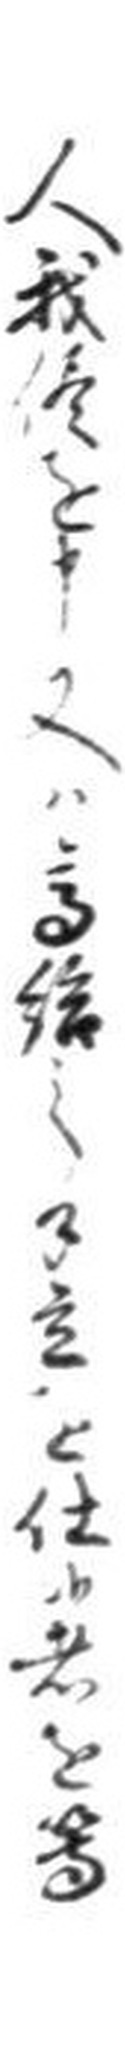人我侭を申又ハ高給之手立を仕候者を等
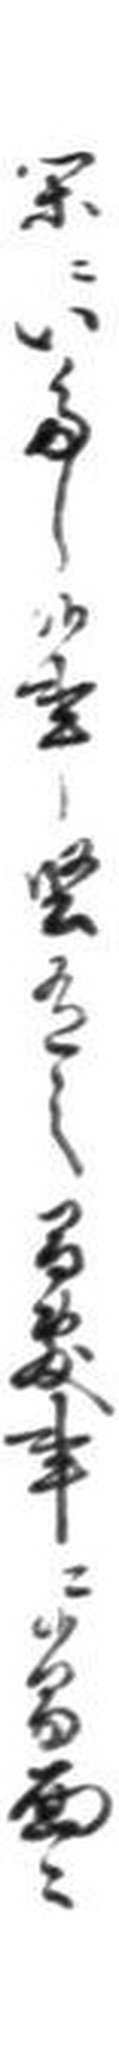閑ニいたし候事堅有之間敷事ニ候間面々

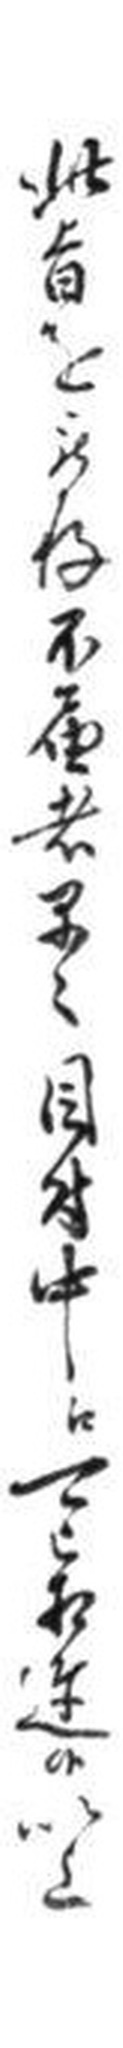此旨を被存不届者早々目付中江可被相達候以上
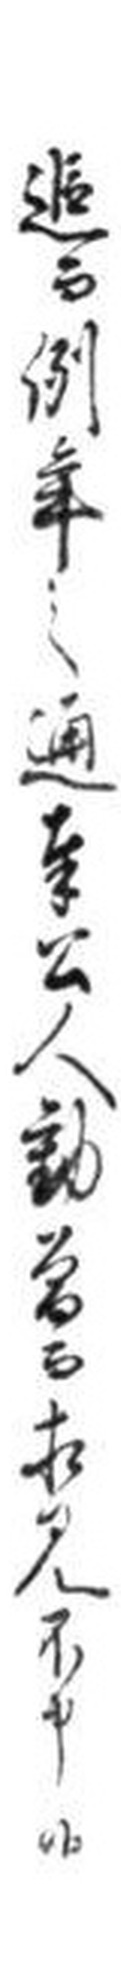追而例年之通奉公人動曽而相見不申候
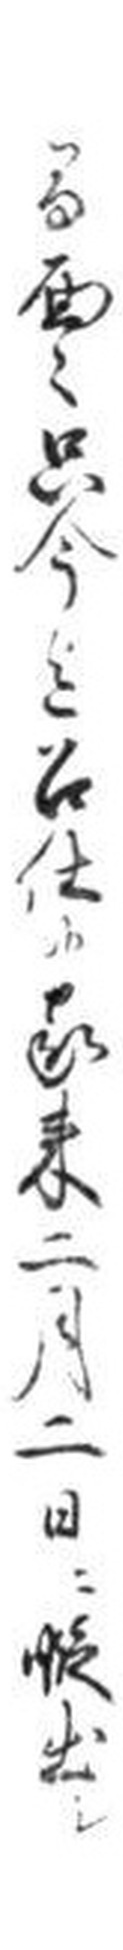間面々只今迄召仕候家来二月二日ニ暇出シ
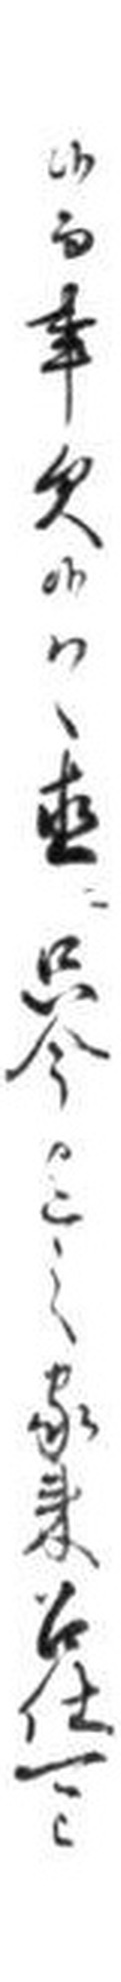候而事欠候八ヽ直ニ只今迄之家来召仕可被
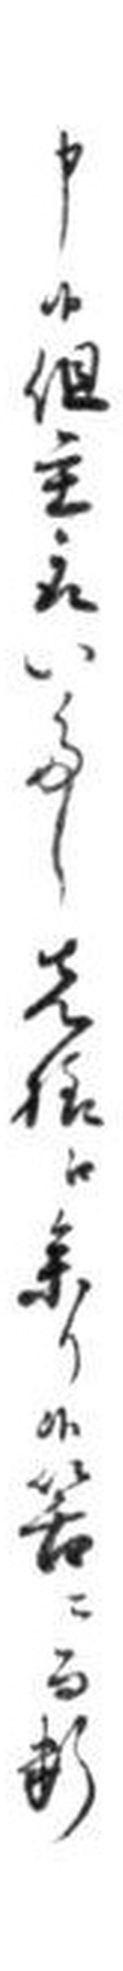申候但主取いたし先様江参り候筈ニ而断
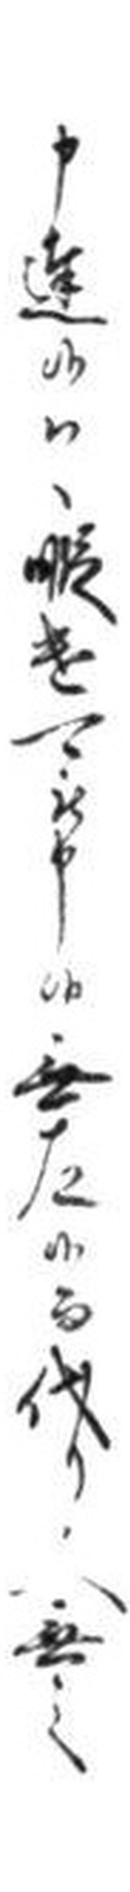申達候八ヽ暇遣可被申候無左候而代り人無之
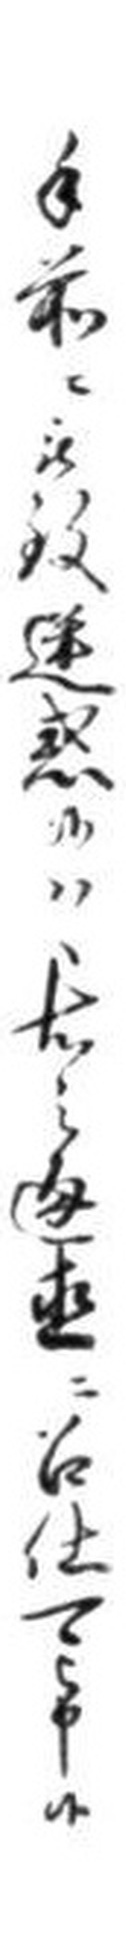手前ニ被致迷惑候ハヽ右之通直ニ召仕可被申候
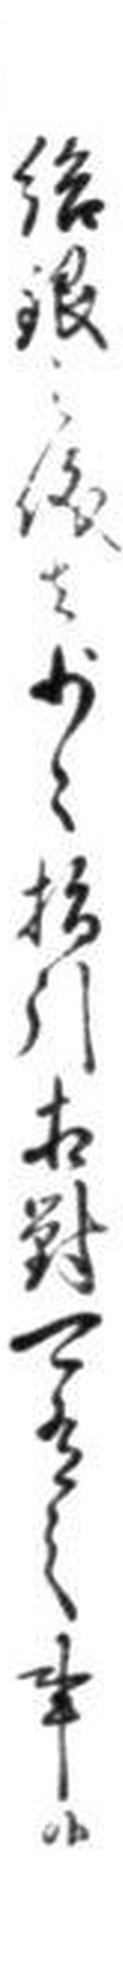給銀之儀者ｓ少々指引相対可有之事候
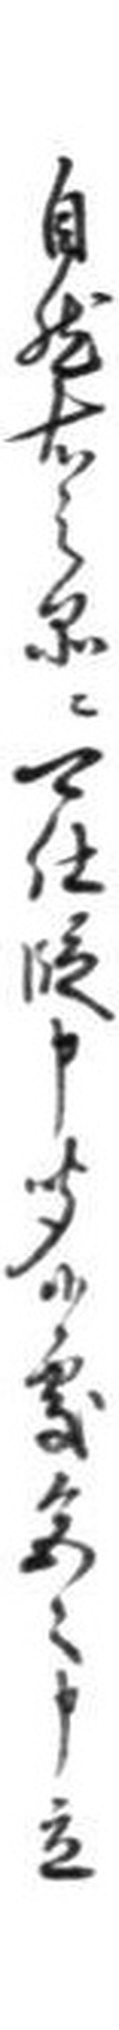自然右之品ニ可仕段申聞候處宮々申立
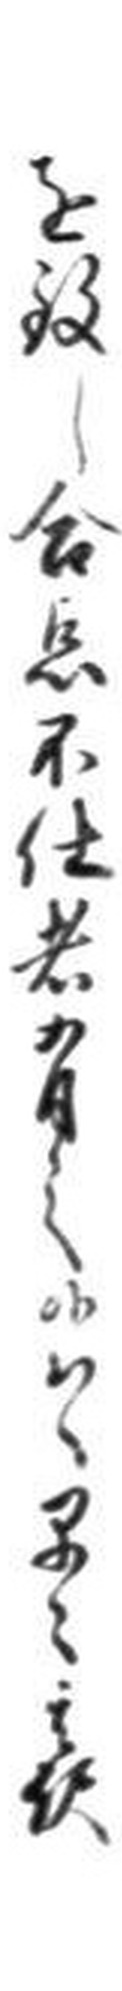を致し合点不仕者有之候ハヽ早々其訳
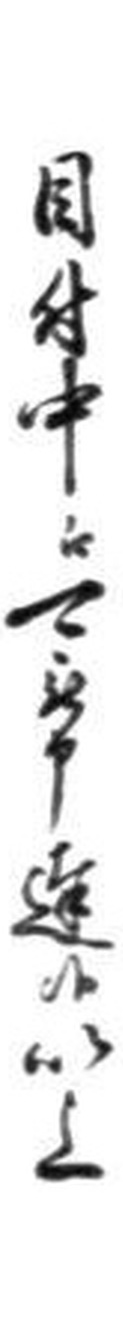目付中江可被申達候以上
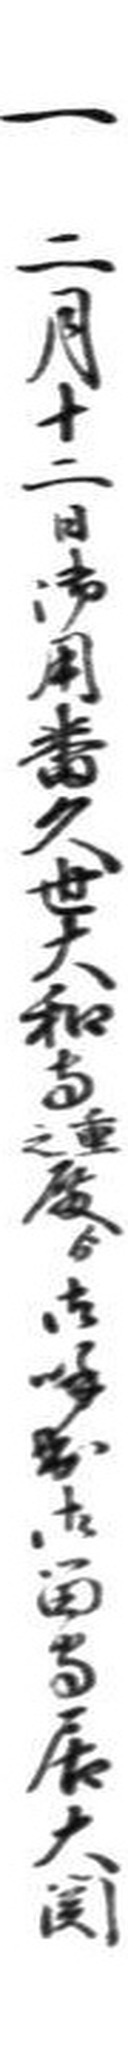一二月十二日御用番久世大和守重之殿ゟ御呼出御留守居大関
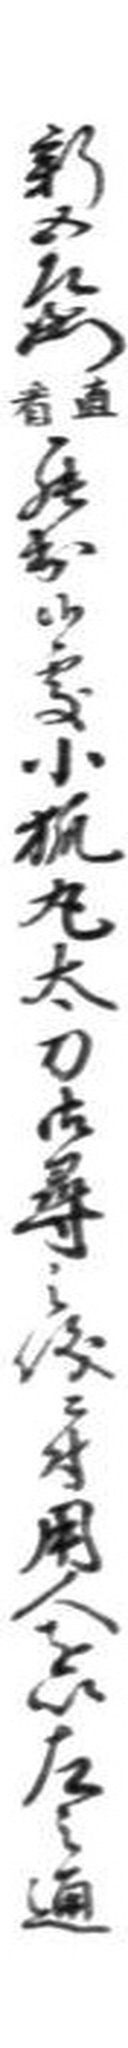新五左衛門直看罷出候處小狐丸太刀御尋之儀ニ付用人を以左之通
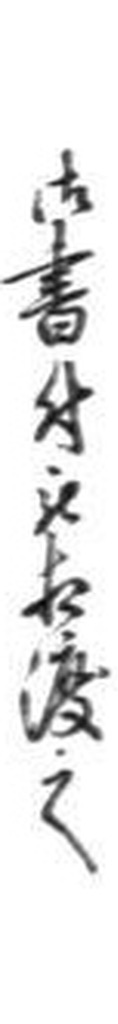御書付被相渡之
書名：家譜 三十四 吉邦公 従享保五年到同六年
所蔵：福井県文書館 Fukui Prefectural Archives
